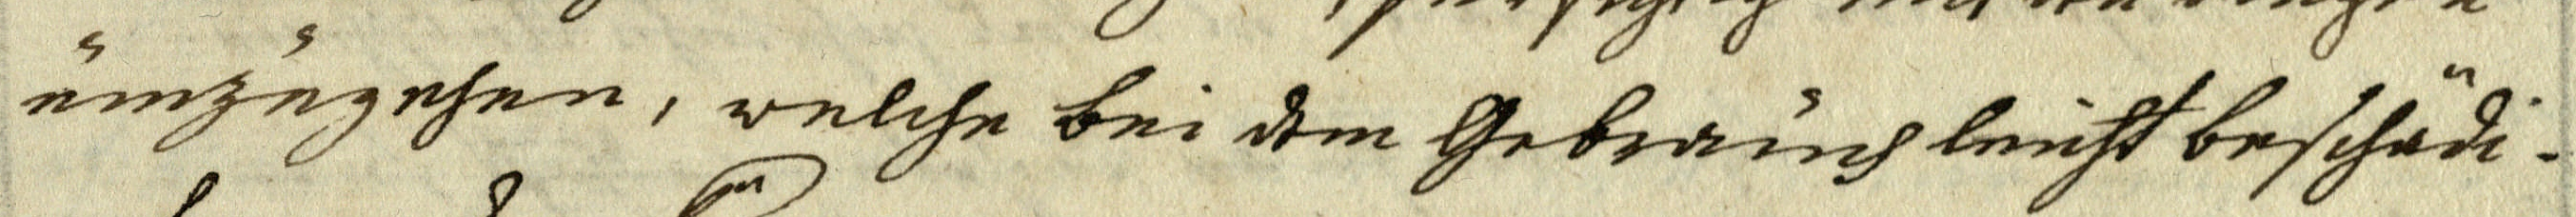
umzugehen, welche bei dem Gebrauch leicht beschädi¬
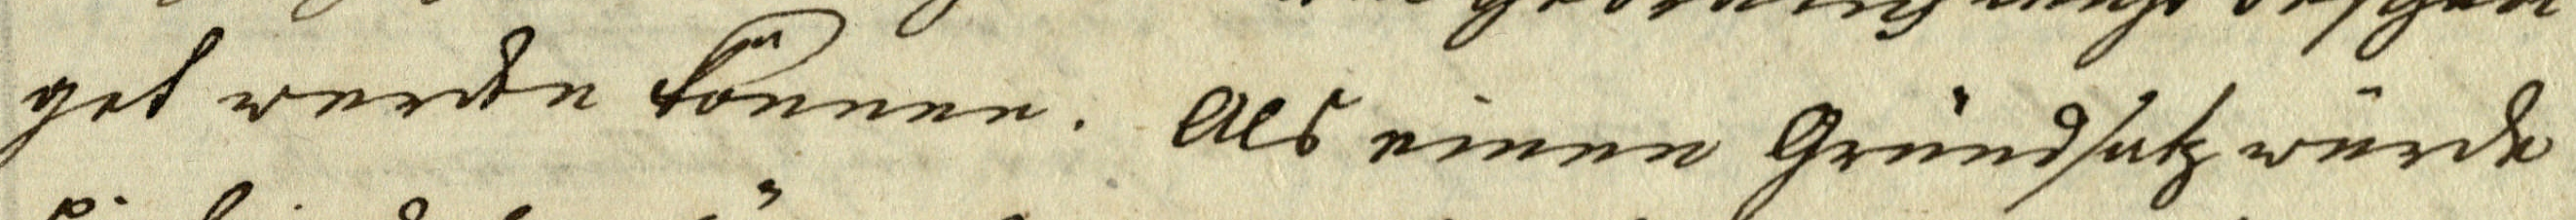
get werden können. Als einen Grundsatz würde
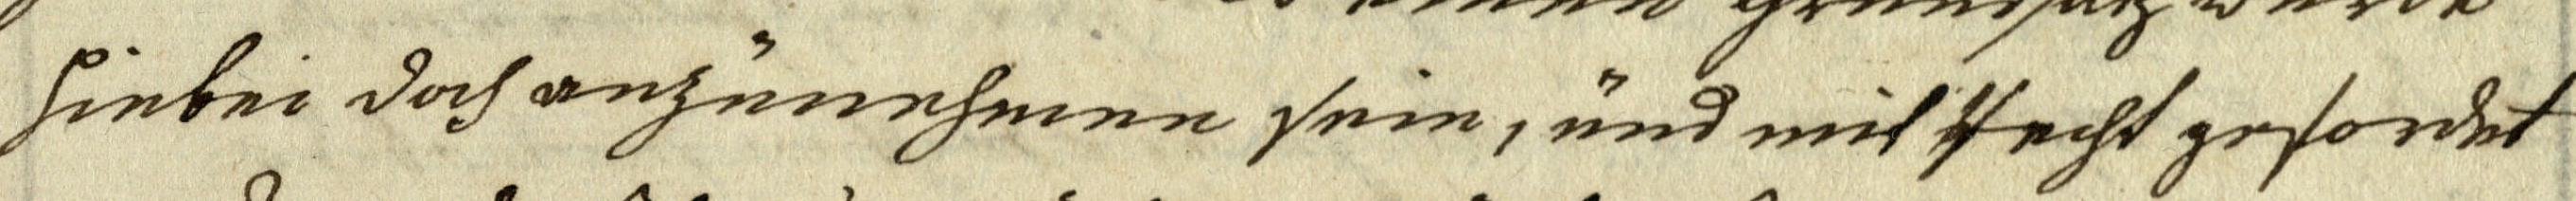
hiebei doch anzunehmen sein, und mit Recht gefordert
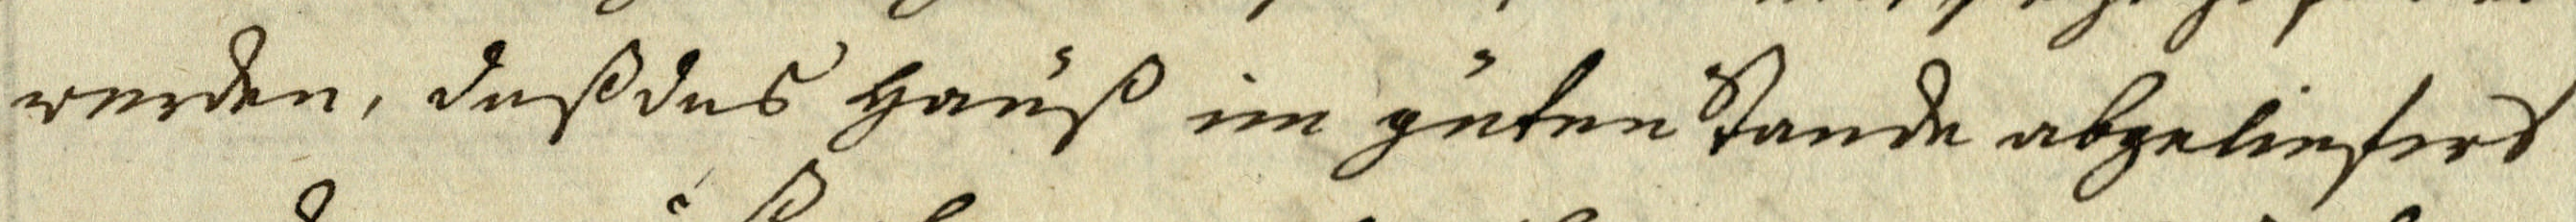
werden, daß das haus im guten Stande abgeliefert
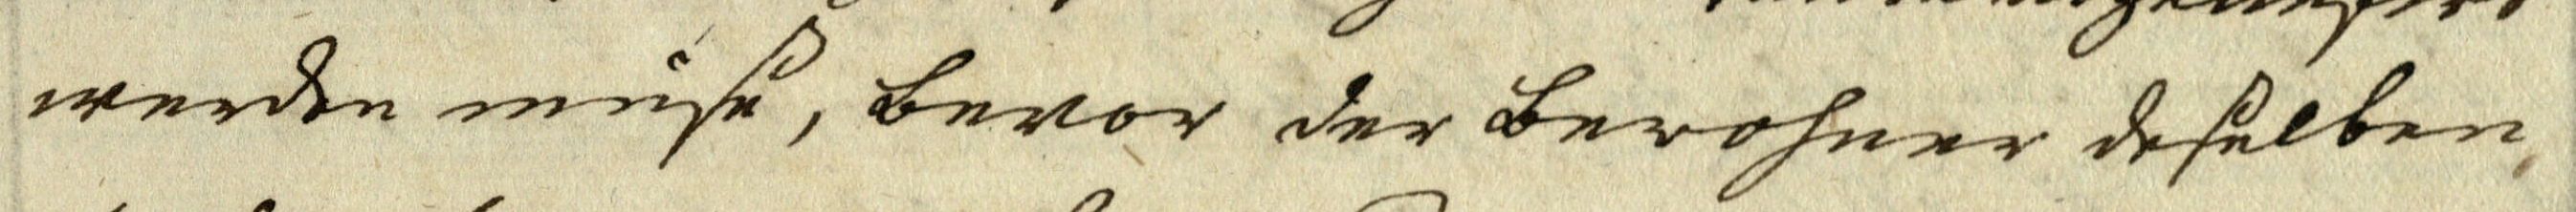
werden müße, bevor der Bewohner deßelben
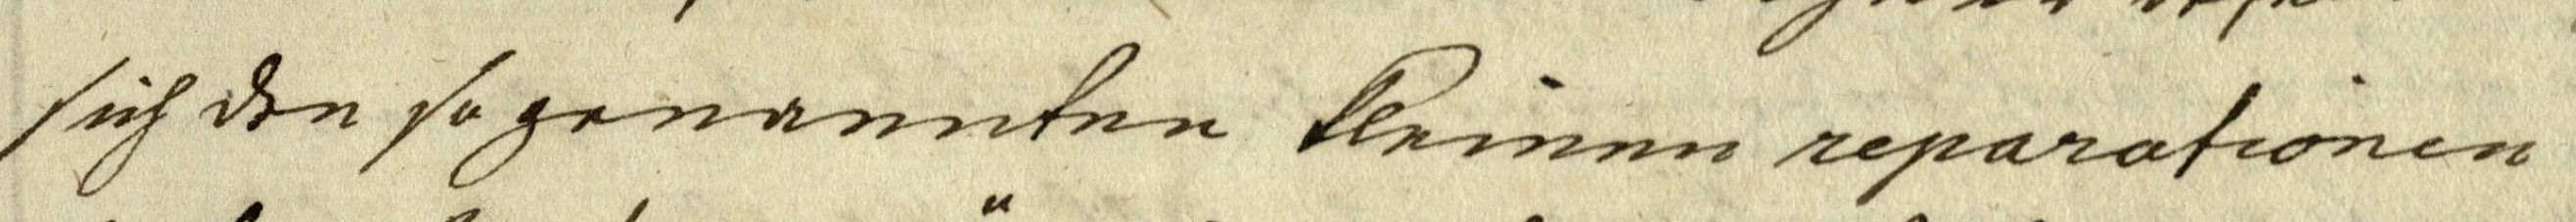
sich den sogenannten kleinen reparationen
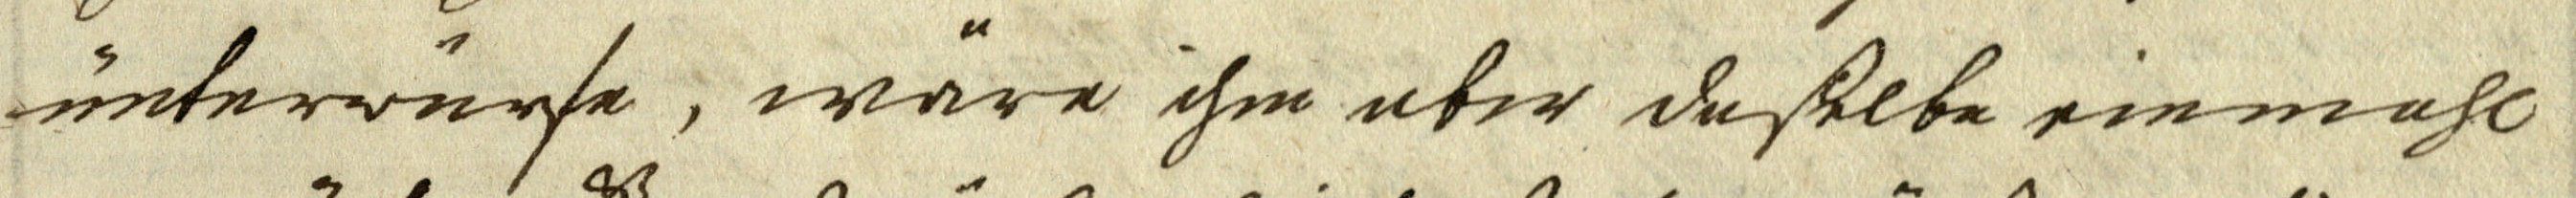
unterwürfe, wäre ihm aber daßelbe einmahl
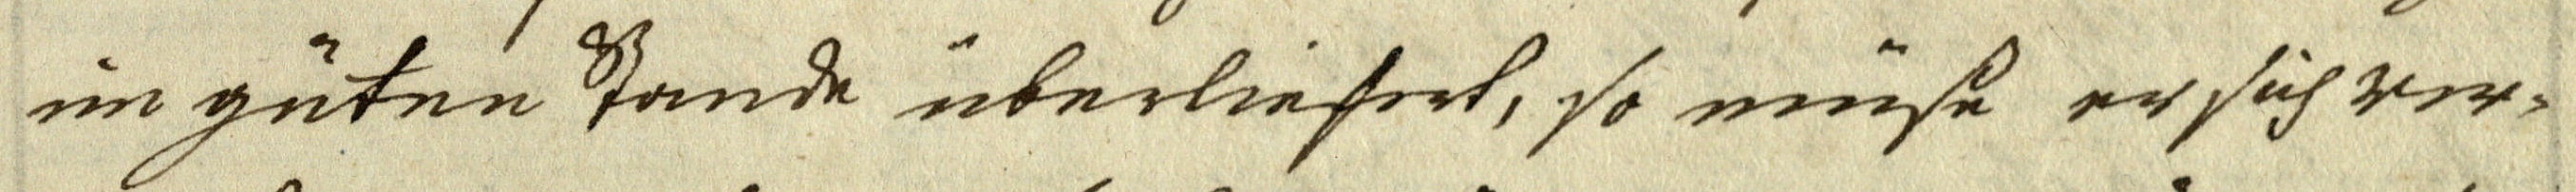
im guten Stande überliefert, so müße er sich ver¬
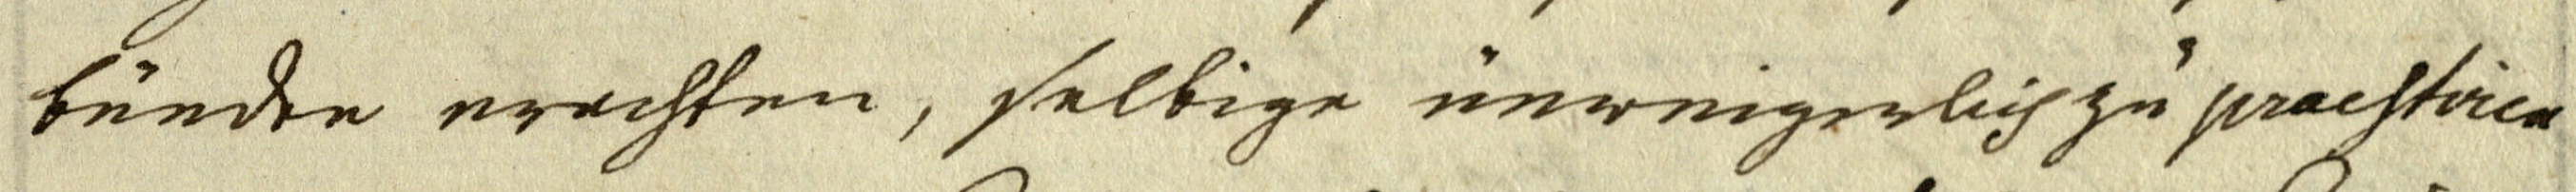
bunden erachten, selbige unweigerlich zu praestiren.
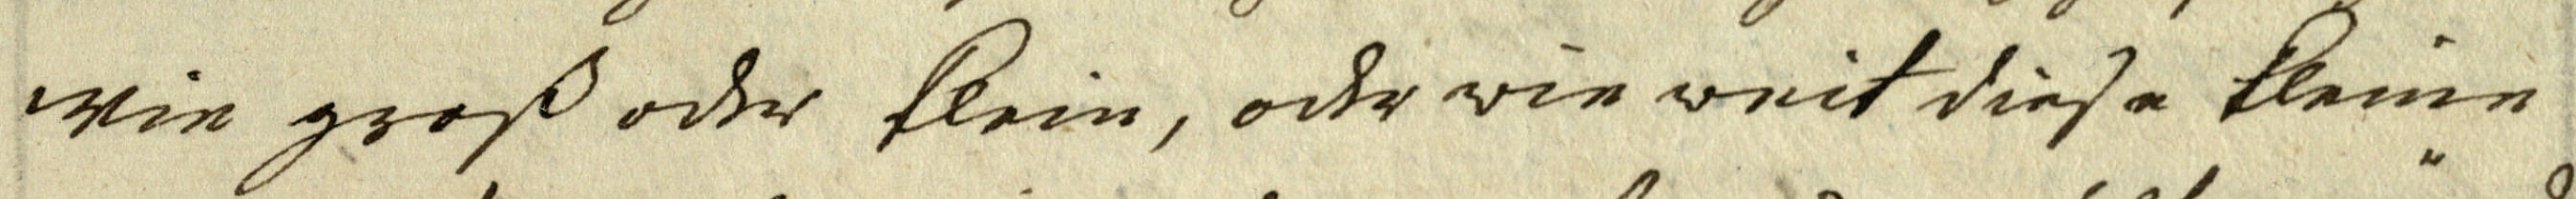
Wie groß oder klein, oder wie weit diese kleine
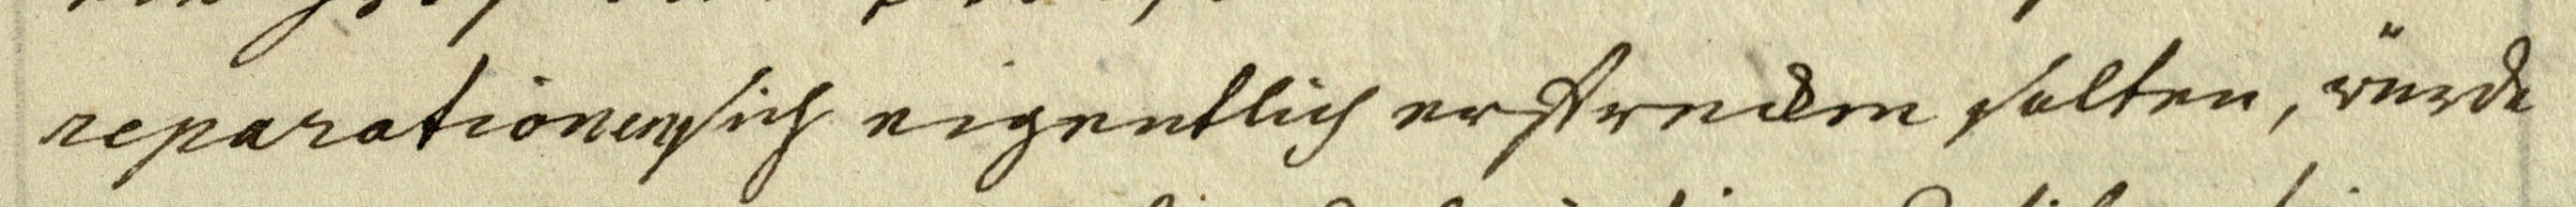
reparationen sich eigentlich erstrecken solten, würde
